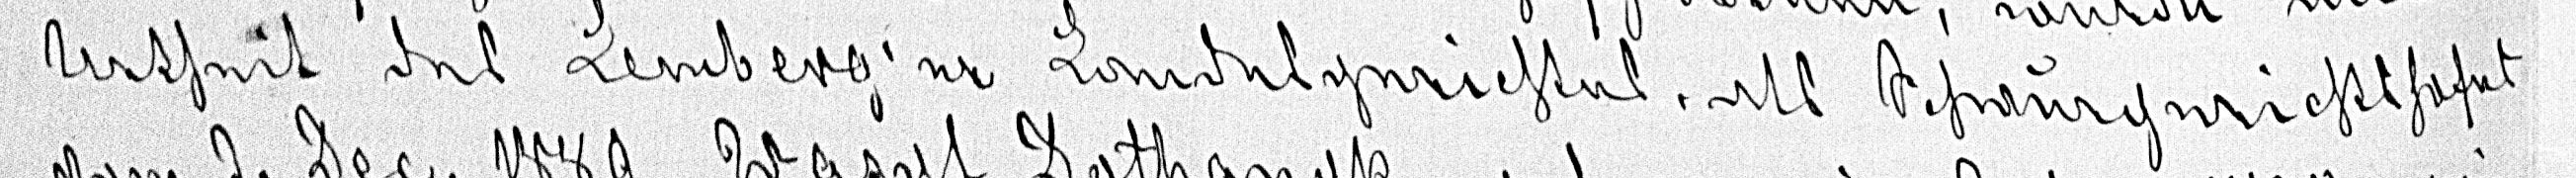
Urtheil des Lemberg'er Landesgerichtes-als Schwurgerichtshofes
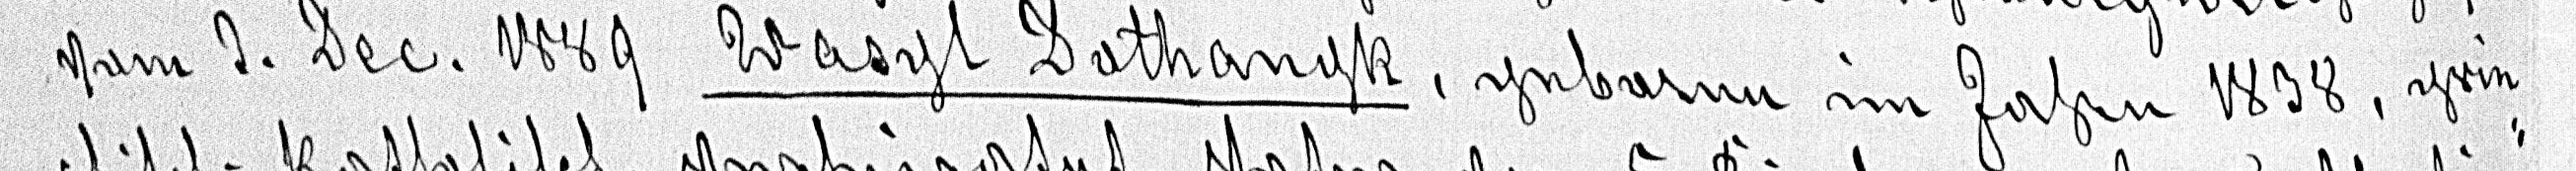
vom 3. Dec. 1889 Wasyl Dothanyk, geboren im Jahre 1838, grie¬
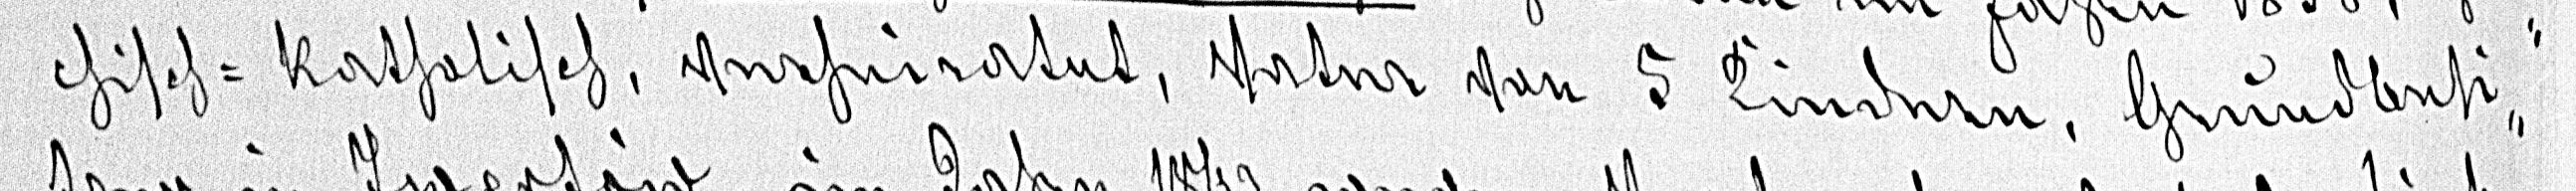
chisch-katholisch, verheiratet, Vater von 5 Kindern, Grundbesi¬
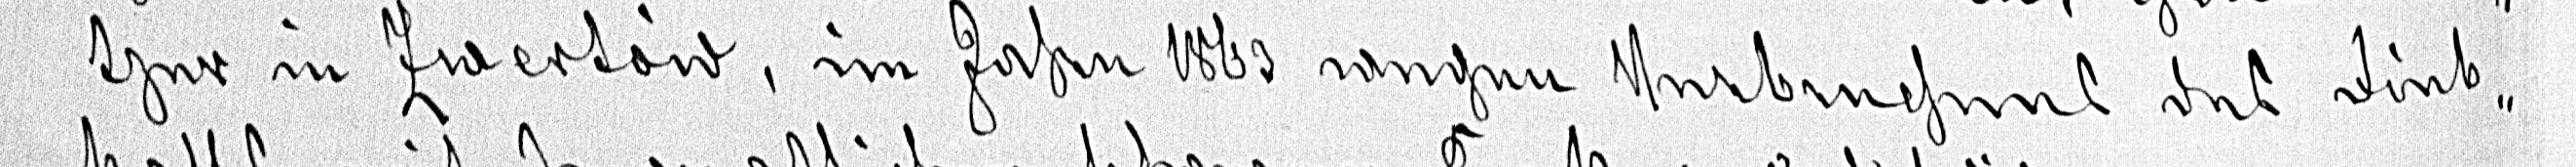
tzer in Zwertów, im Jahre 1863 wegen Verbrechens des Dieb¬
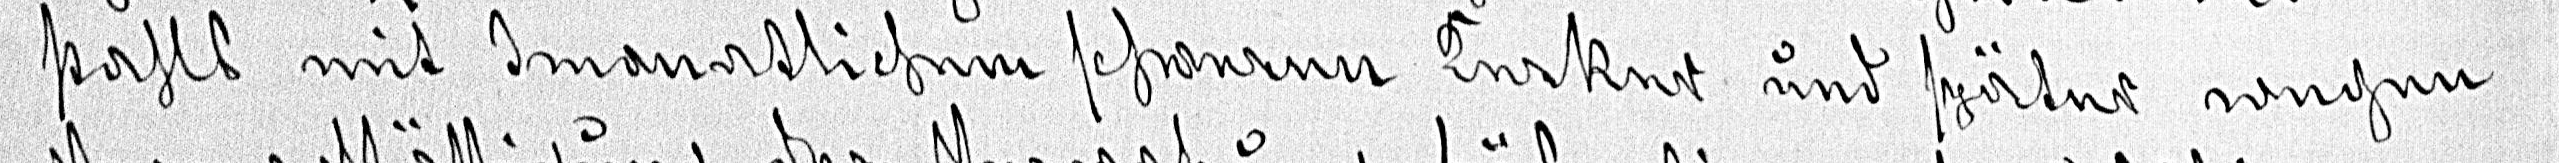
stahls mit xxmonatlichem schweren Kerker und später wegen
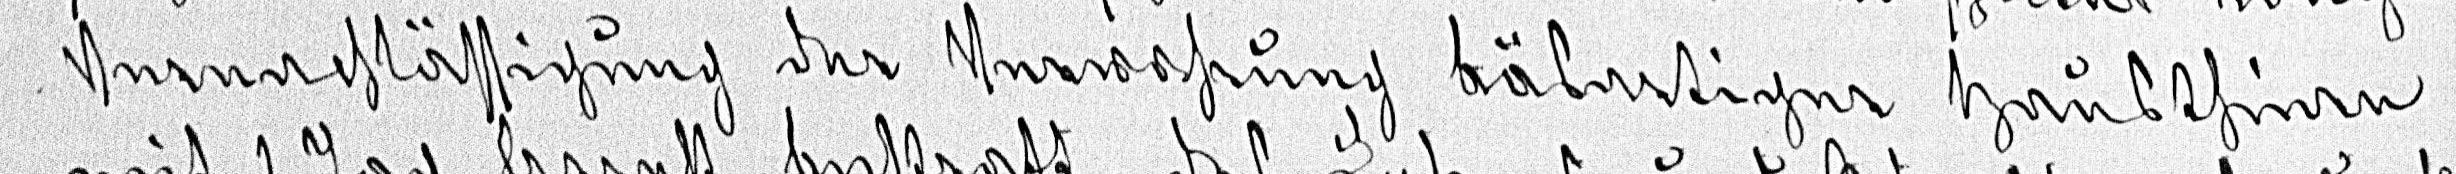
Vernachlässigung der Verwehrung bösartiger Hausthiere
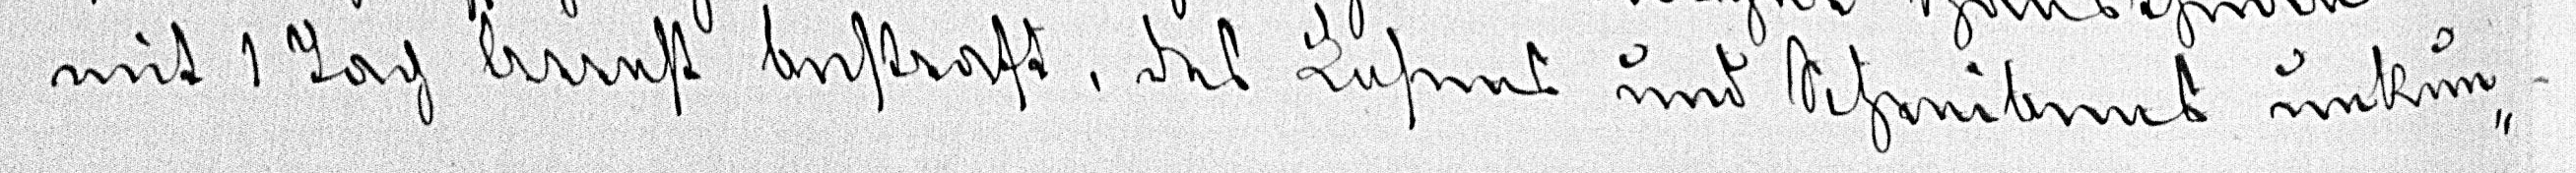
mit 1 Tag Arrest bestraft, des Lehens und Schreibens unkun¬
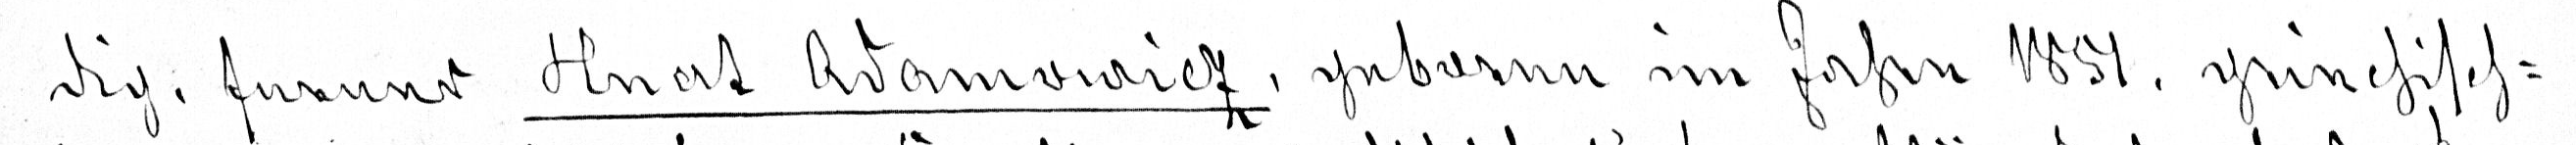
dig, ferner Hnat Adamowicz, geborne im Jahre 1851, griechisch-
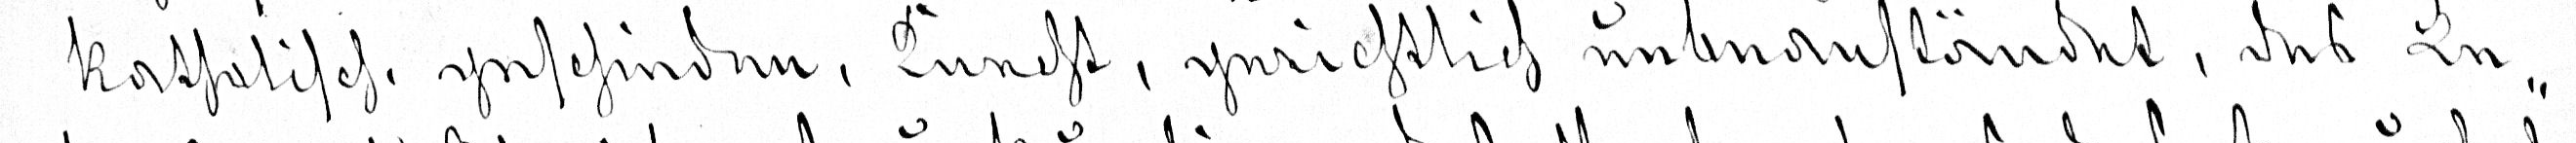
katholisch, geschieden, Knecht, gerichtlich unbeanständet, des Le¬
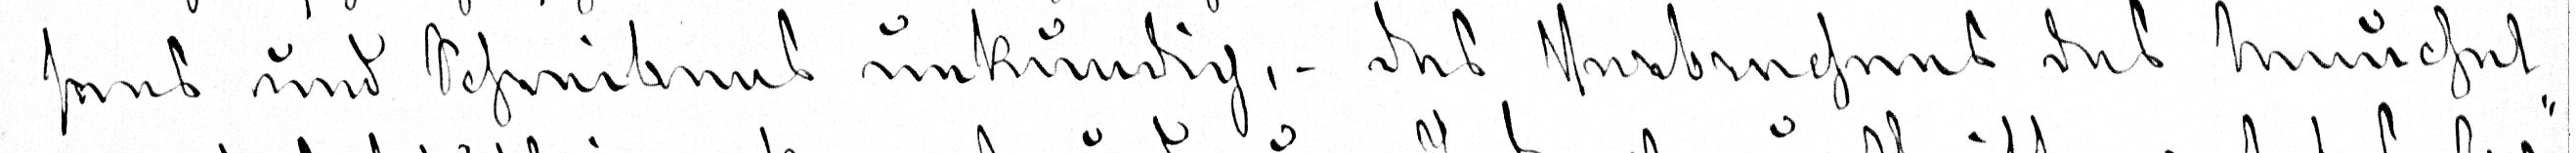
sens und Schreibens unkundig,- des Verbrechens des Meuchel¬
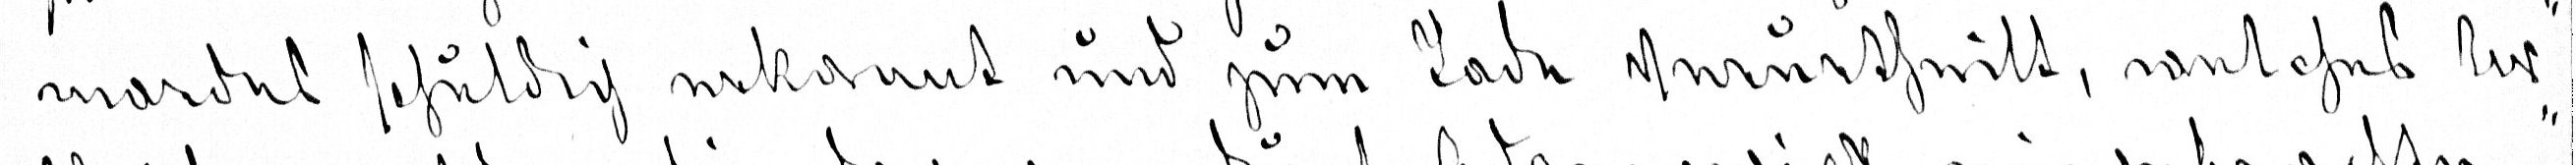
mordes schuldig erkannt und zum Tode verurtheilt, welches Ur¬
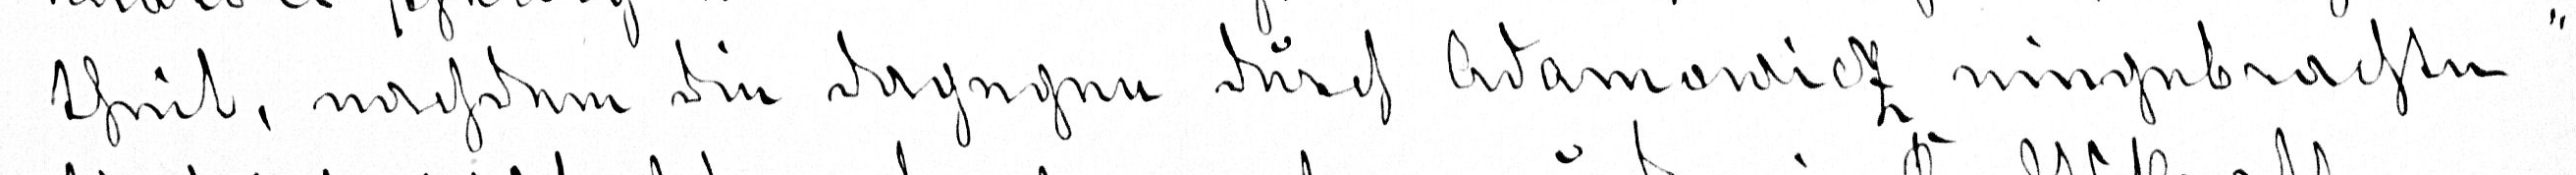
theil, nachdem die dagegen durch Adamowicz eingebrachte
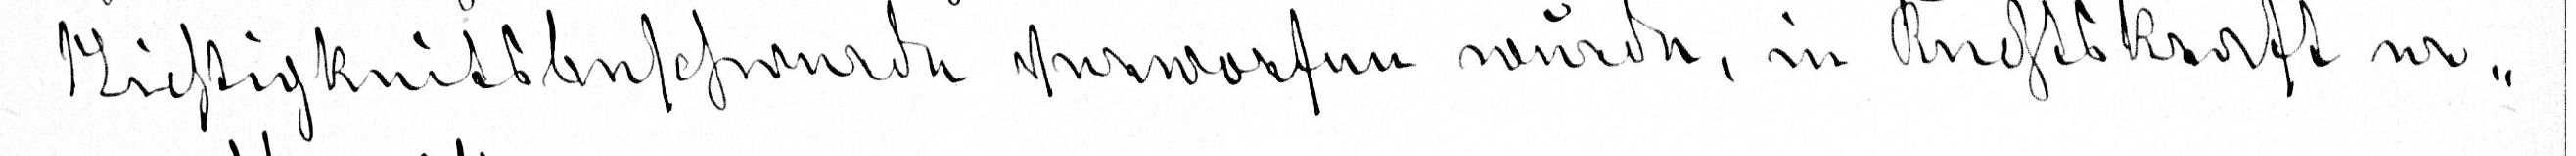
Nichtigkeitsbeschwerde verworfen wurde, in Rechtskraft er¬
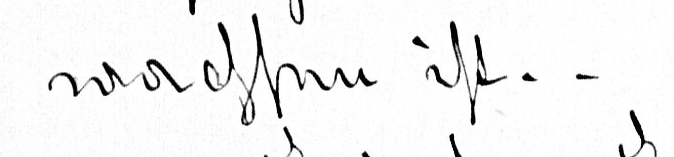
wachsen ist.-
